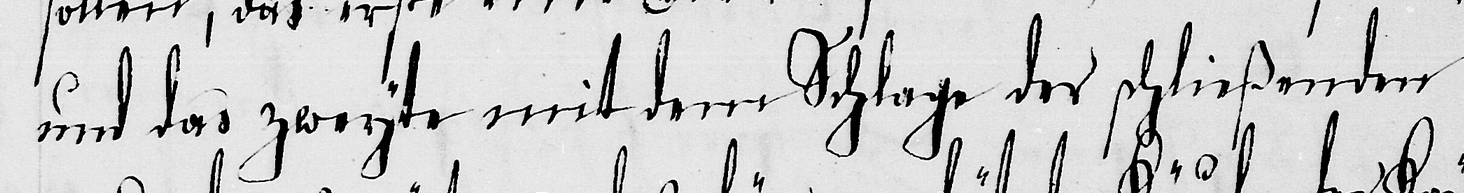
und das zweyte mit dem Schlage der schließenden
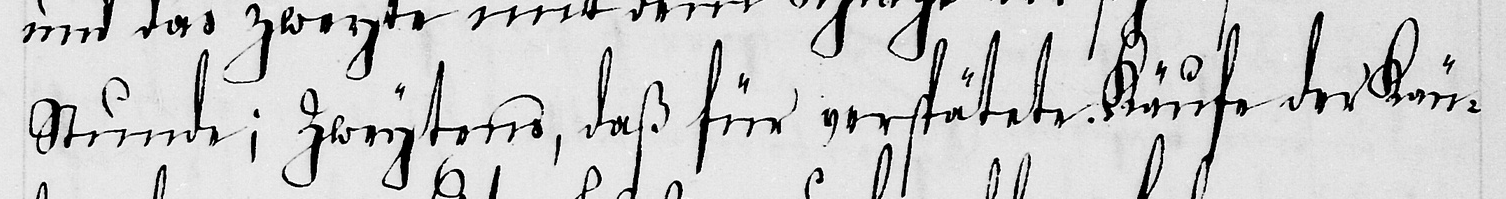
Stunde; Zweytens, daß für verspätete Käufe der Käu¬
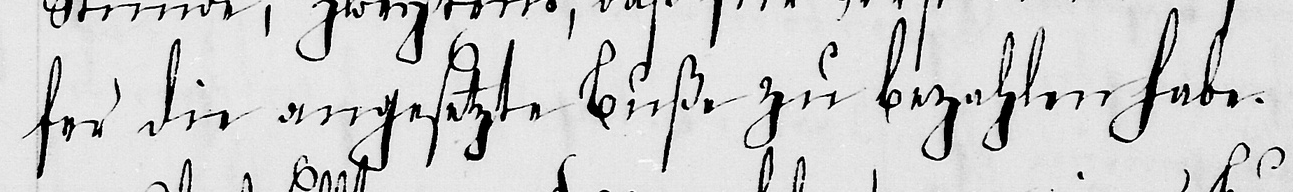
fer die angesetzte Buße zu bezahlen habe.
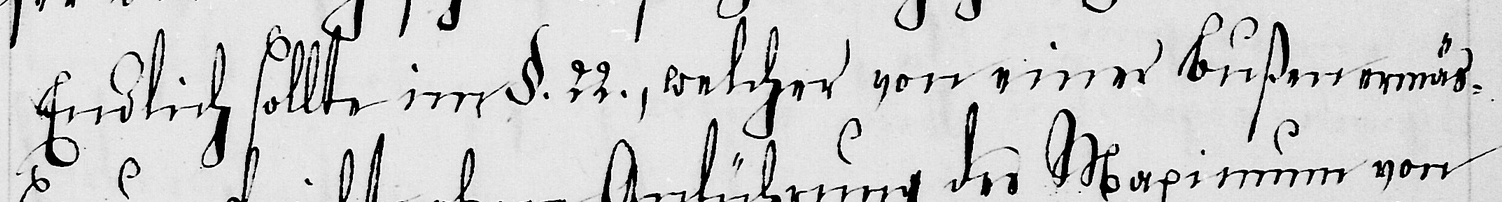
Endlich sollte im §§. 22., welcher von einer Bußenermäß¬
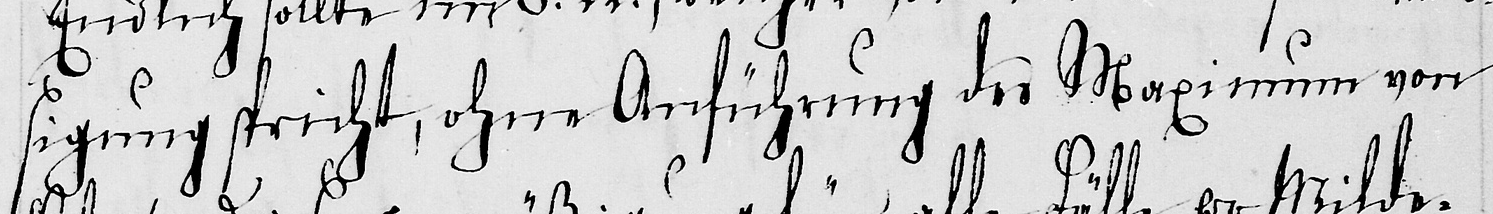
igung spricht, ohne Anführung des Maximum von
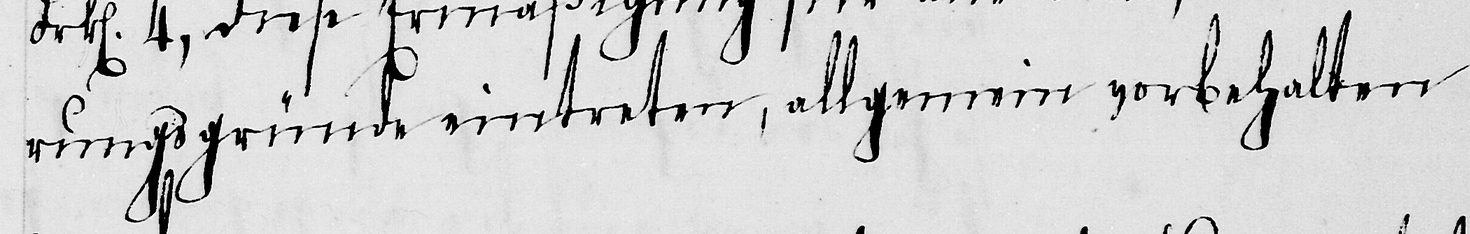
rungsgründe eintreten, allgemein vorbehalten
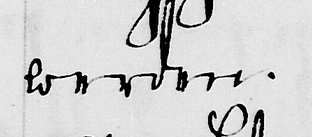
werden.
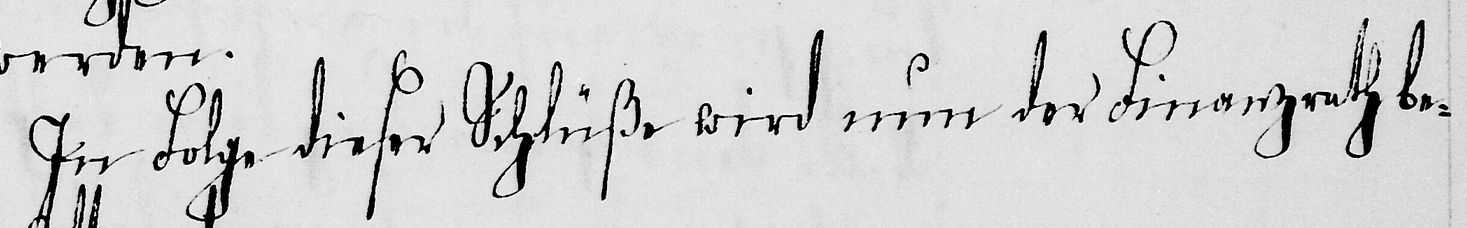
In Folge dieser Schlüße wird nun der Finanzrath be¬
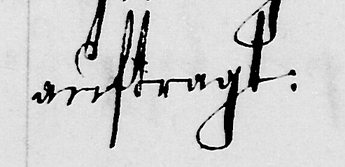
auftragt:
